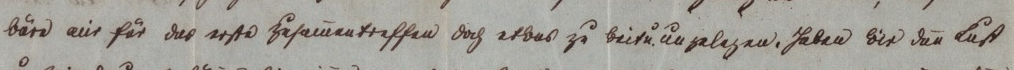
wäre mir für das erste Zusammentreffen doch etwas zu weit u. ungelegen. Haben wir dann Lust
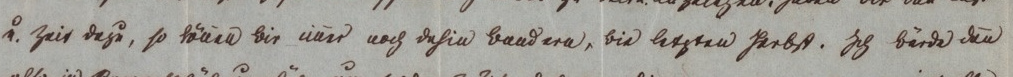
u. Zeit dazu, so können wir immer noch dahin wandern, wie letzten Herbst. Ich würde dann
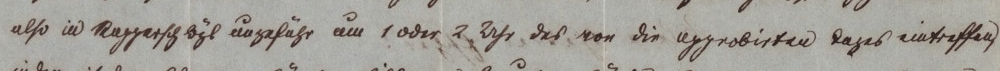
also in Rapperschwyl ungefähr um 1 oder 2 Uhr des von dir approbirten Tages eintreffen,
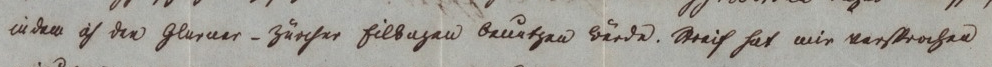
indem ich den Glarner–Zürcher Eilwagen benutzen würde. Streif hat mir versprochen
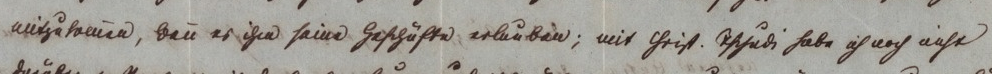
mitzukommen, wenn es ihm seine Geschäfte erlauben; mit Christ. Tschudi habe ich noch nicht
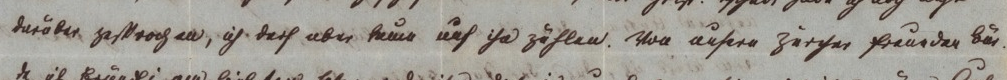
darüber gesprochen, ich darf aber kaum auf ihn zählen. Von unsern Zürcher Freunden wür-
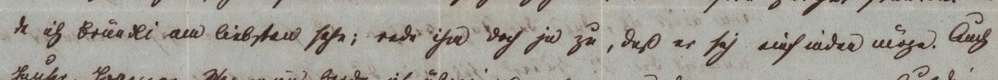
de ich Brändli am liebsten sehn; rede ihm doch ja zu, daß er sich einfinden möge. Auch
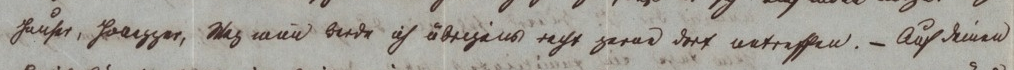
Hauser, Honegger, Wegmann werde ich übrigens recht gerne dort antreffen. – Auf deinen
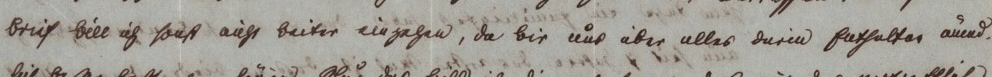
Brief will ich sonst nicht weiter eingehen, da wir uns über alles darin Enthaltne münd-
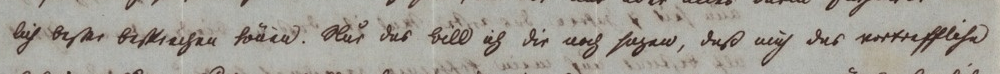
lich besser besprechen können. Nur das will ich dir noch sagen, daß mich das vortreffliche
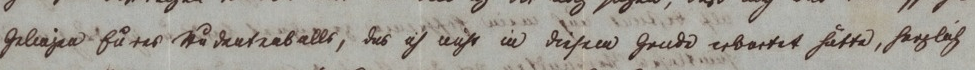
Gelingen Eures Studentenballs, das ich nicht in diesem Grade erwartet hätte, herzlich
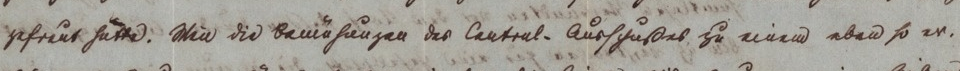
gefreut hatte. Wenn die Bemühungen des Central-Ausschusses zu einem eben so er-
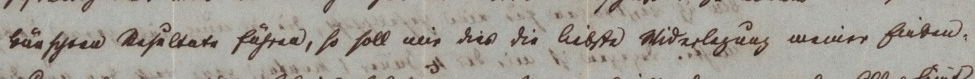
wünschten Resultate führen, so soll mir dies die liebste Widerlegung meiner Einwen-
